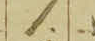1.
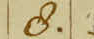8.
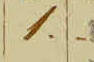1.
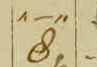8.
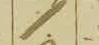1.
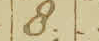8.
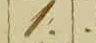1.
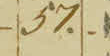57.
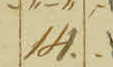14.
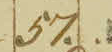57.
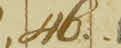46.
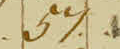57.
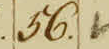56.
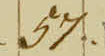57
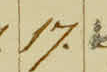17.
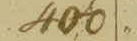400.
